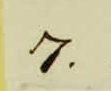7.
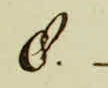8.
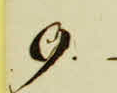9.
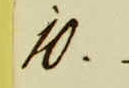10.
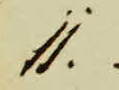11.
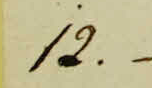12.
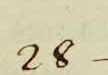28
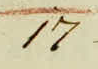17
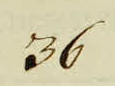36
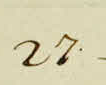27
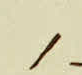1
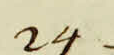24
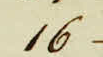16
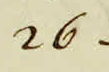26
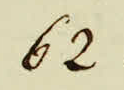62
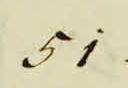51
